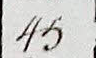45
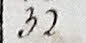32
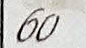60
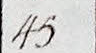45
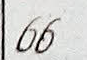66
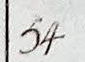54
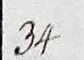34
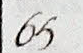65
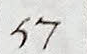57
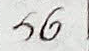56
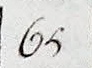65
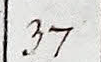37
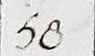58
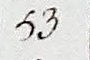53
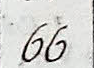66
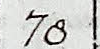78
